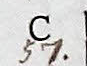57
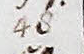48
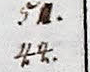44.
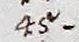45
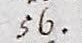56
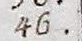46
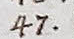47
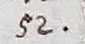52
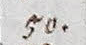50
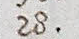28
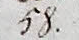58
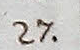27.
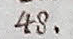48
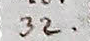32
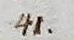41
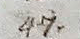47
